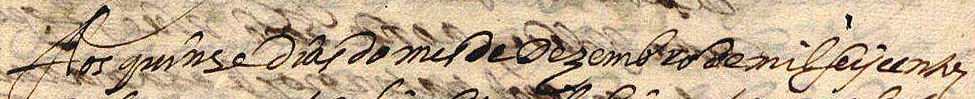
Aos quinze dias do mes de Dezembro de mil seiscentos
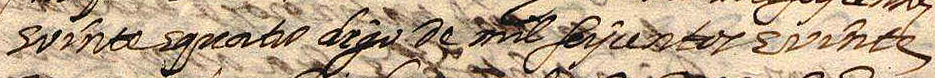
E vinte E quatro digo de mil seiscentos E vinte
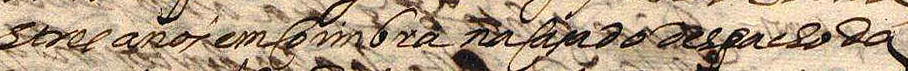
E tres anos em Coimbra na Casa do despacho da
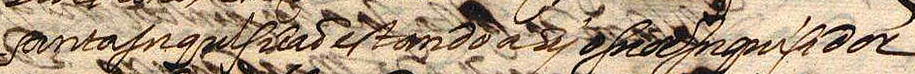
santa jnquisiçaõ estando ahy o snor̄ Jnquisidor
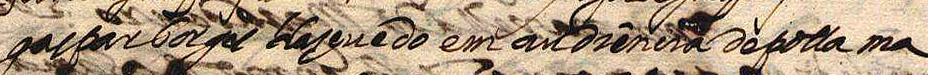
gaspar borges dazeuedo em audiencia de polla ma
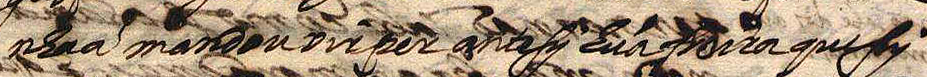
nhaā mandou vir perante sy huā freira que foy
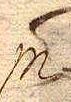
m
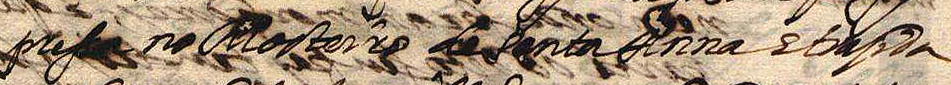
presa no Mosteiro de santa Anna E trazida
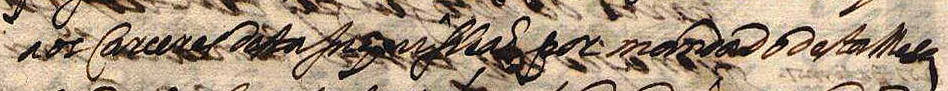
aos Carceres desta Jnquisiçaõ por mandado desta Mesa
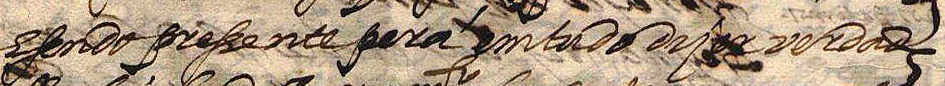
E sendo pressente pera em tudo dizer verdade
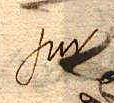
jur
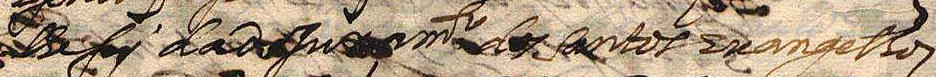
lhe foy dado Juram.to dos santos Euangelhos
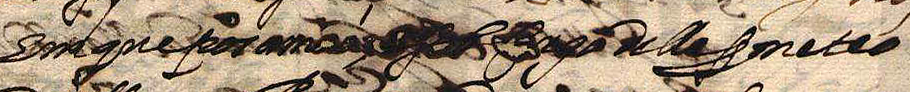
Em que pos a maõ, e sob Cargo delle ꝓmeteo
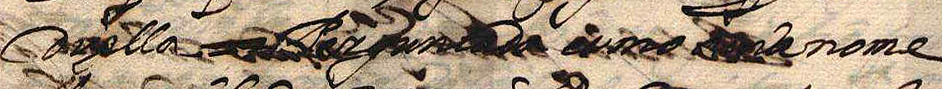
dizella = Perguntada como auia nome
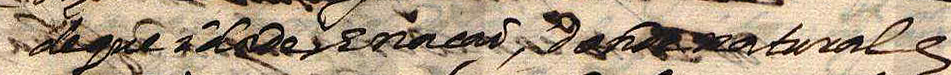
de que idade E naçaõ, donde natural e
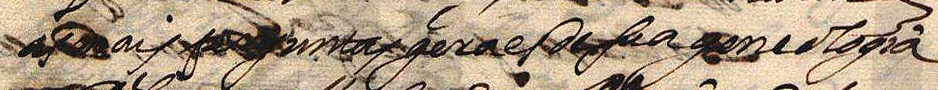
as mais perguntas geraes de sua geneologia
